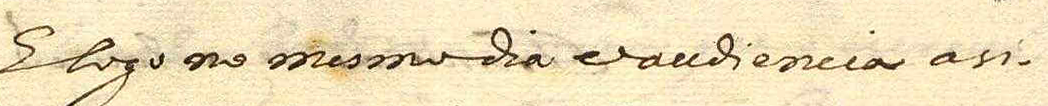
E logo no mesmo dia e audiencia asi
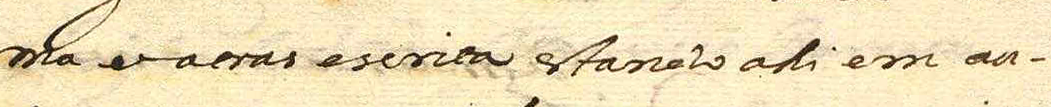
ma e atras escrita estando ahi em au
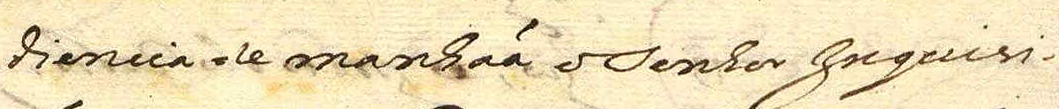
diencia de manhaã o senhor Jnquisi
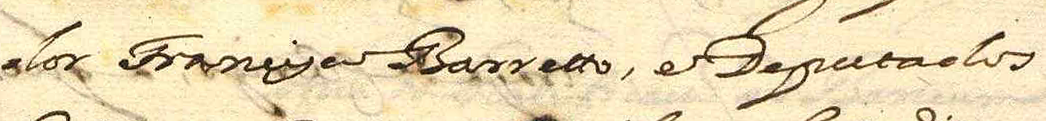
dor Francisco Barretto, e Deputados
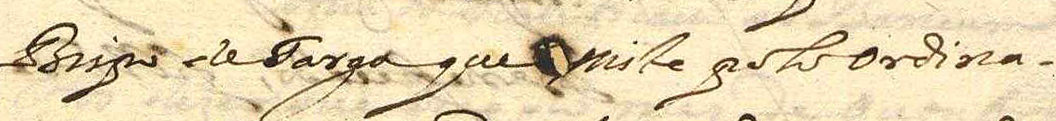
Bispo de Targa que _ssiste polo ordina
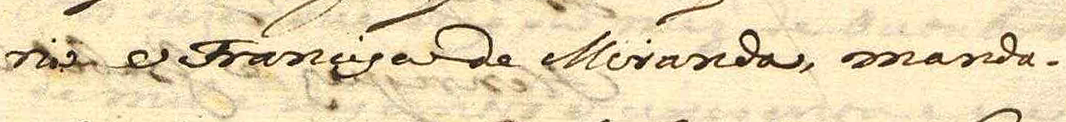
rio e Francisco de Miranda, manda
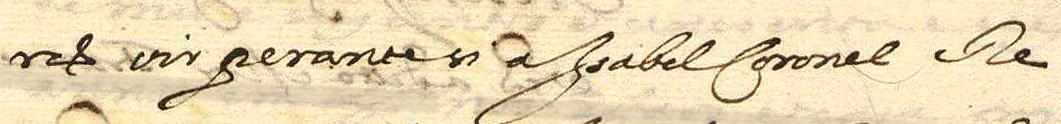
raõ vir perante si a Jsabel Coronel Re
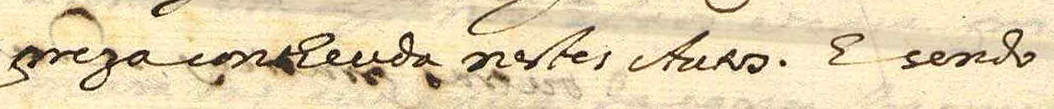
preza contheuda nestes Autos. E sendo
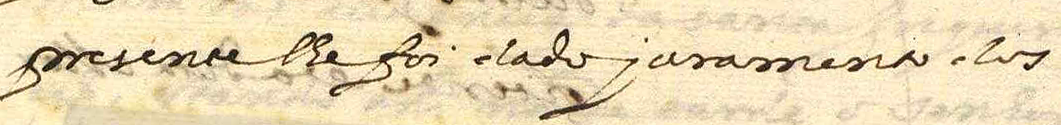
presente lhe foi dado juramento dos
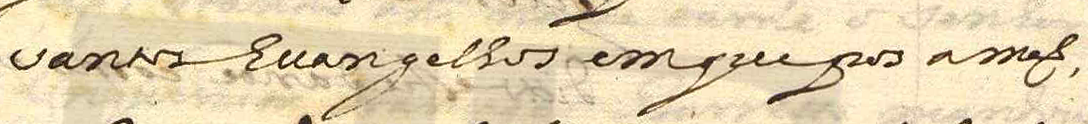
santos Euangelhos em que pos a maõ,
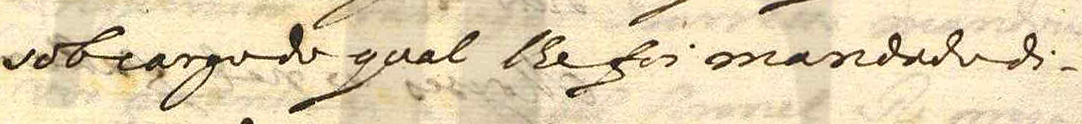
sob cargo do qual lhe foi mandado di
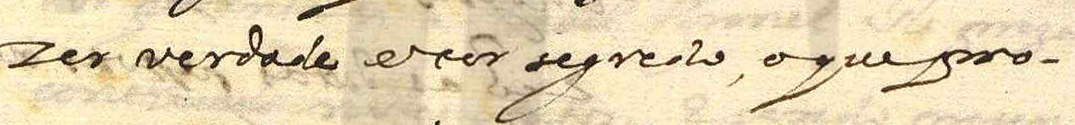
zer verdade e ter segredo, o que pro
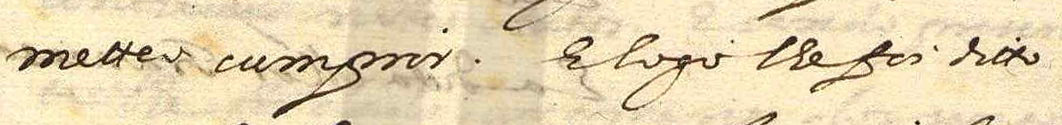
metteo cumprir. E logo lhe foi ditto
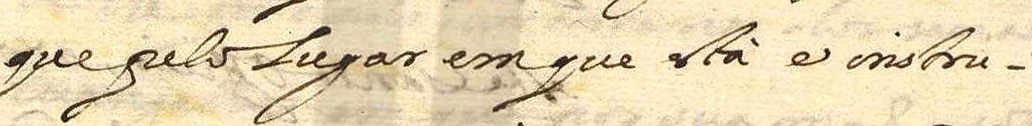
que pelo lugar em que está e instru
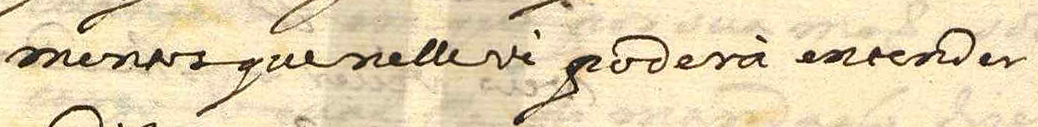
mentos que nelle vi poderá entender
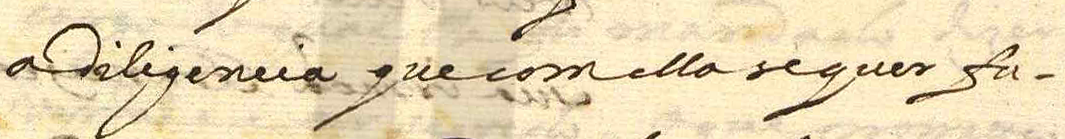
a diligencia que com ella se quer fa
